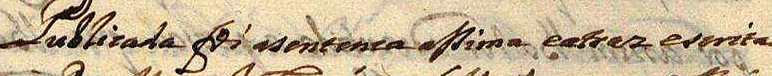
Publicada foi a sentença assima e atraz escrita
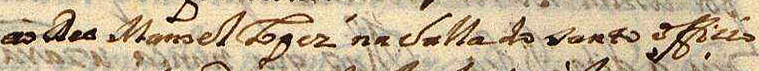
ao Reo Manoel Lopez na Salla do santo officio
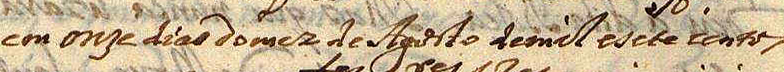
em onze dias do mez de Agosto de mil e setecentos
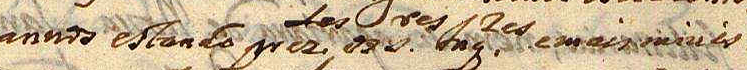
annos estando prez.tes os s.res Inq.res e mais minis
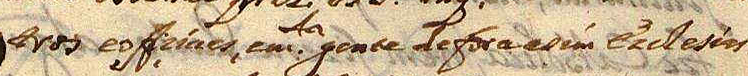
tros e offiçiaes, e m.ta gente de fora asim Ecclesias
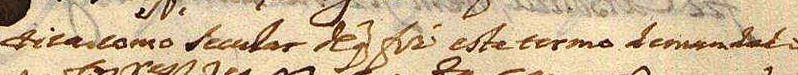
tica como secular de q̄ fiz este termo de mandado
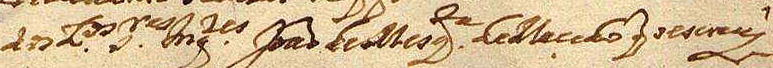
dos d̄.os s.res Inq.res Joaõ de Mesq.ta de Maçedo q̄ o escreuj
